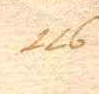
116
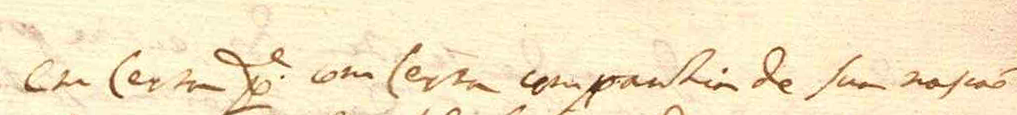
em Certa p.te com Certa companhia de sua nassaõ
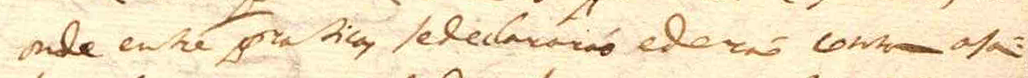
onde entre praticas se declararaõ e deraõ conta a sa
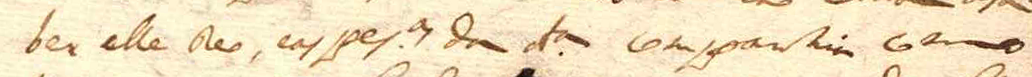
ber elle Reo, e as pes.as da d̄a companhia Como
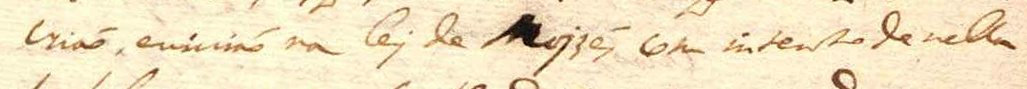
criaõ, e uiuiaõ na lej de Mojzés com intento de nella
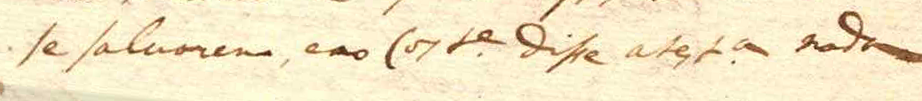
se saluarem, e ao Cost.e disse a test.a nada
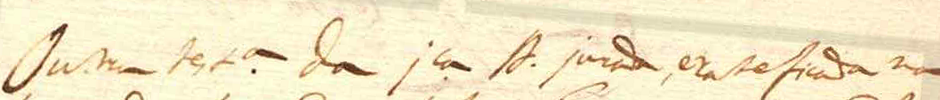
Outra test.a da j.ça A. jurada, e ratificada na
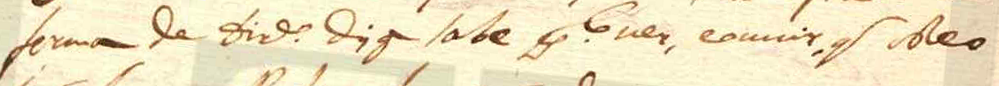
forma de dr.to dise sabe p.lo uer, e ouuir, q̄ o Reo
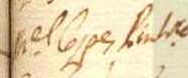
M.el lopes Pinhr.o
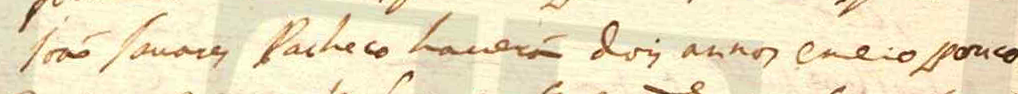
Ioaõ Tavares Pacheco hauerá dois anos e meio pouco
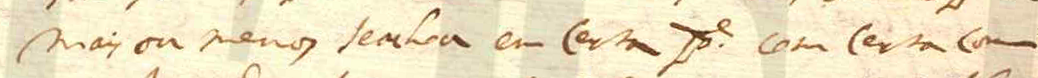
mais ou menos se achou em Certa p.te com Certa com
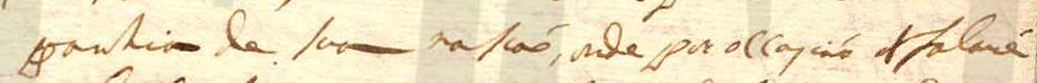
panhia de sua nassaõ, onde por occaziaõ d̄ falarē
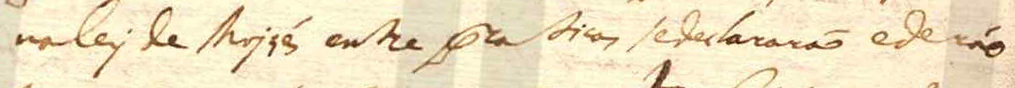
na ley de Mojzés entre praticas se declararaõ e deraõ
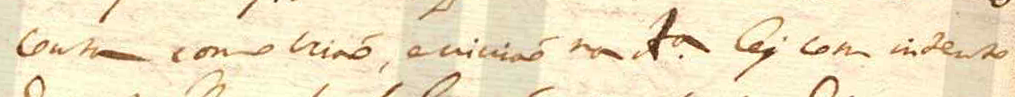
contra como criaõ, e uiuiaõ na d̄.a ley com intento
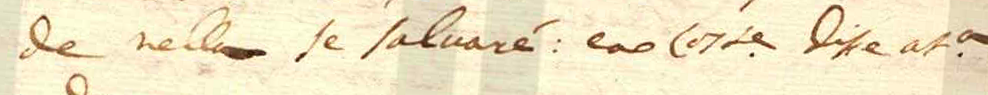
de nella se saluarē: e ao Cost.e disse a t.a
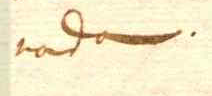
nada.
